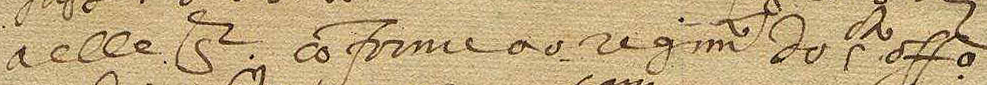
a elle sor. cōforme ao regimto sto. offo.
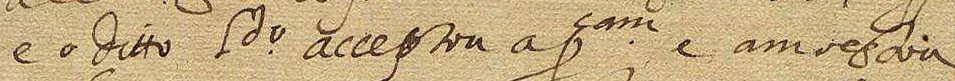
e o ditto Ldo. acceptou a ꝓçam. e amoestou
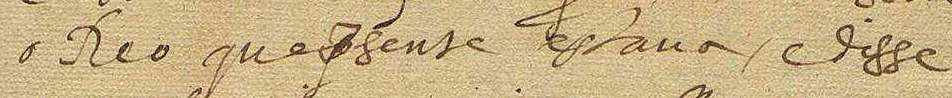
o Reo que p̄sente estaua / e disse
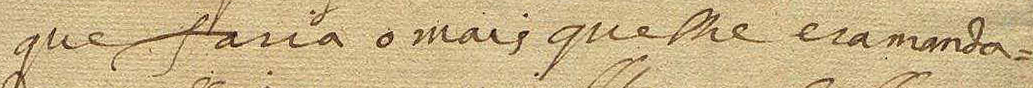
que fazia o mais que lhe era manda
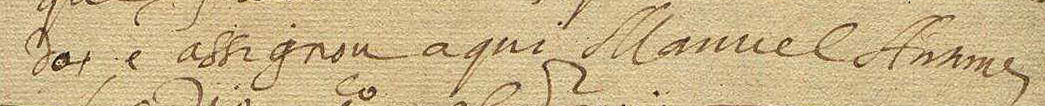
do, e assignou aqui Manuel Antunez
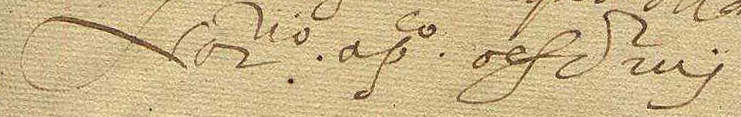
Notrio. apco. o esc̄iuy
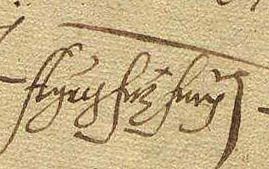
Ayres frz̄ freyre
